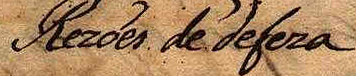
Rezoẽs de defeza
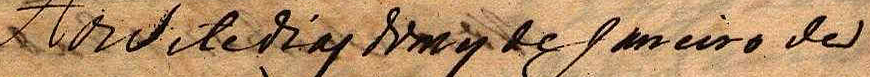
Aoz sete dias do mes de Janeiro de
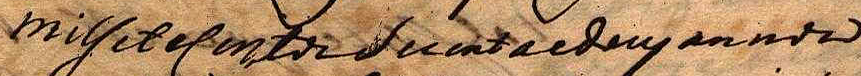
mil seteCentoz secenta e dous annoz
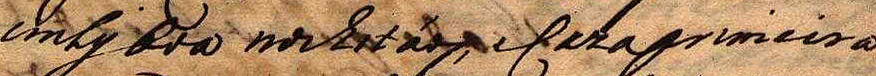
em Lysboa nos Estáos, e Caza primeira
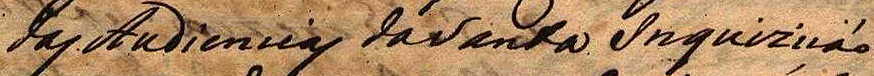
das Audiencias da Santa Inquiziçaõ
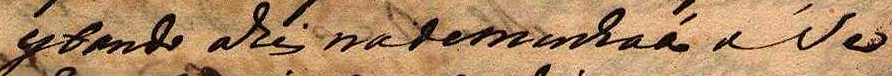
estando ahi na de menhaã o Se
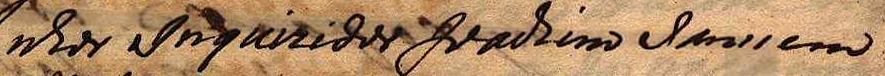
nhor Inquizidor Joachim Ianssem
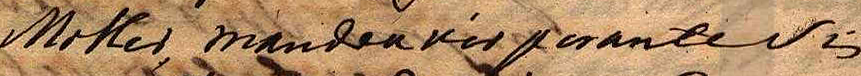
Moller, mandou vir perante Si
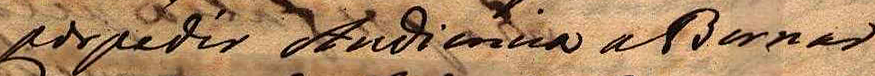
por pedir Audiencia a Bernar
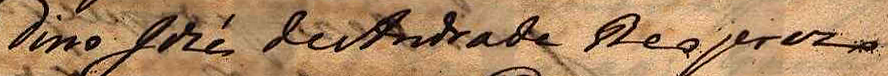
dino Jozé de Andrade Reo prezo
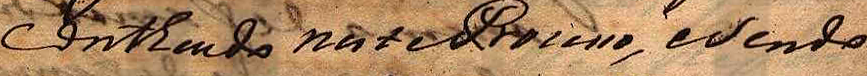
contheudo neste Processo, e sendo
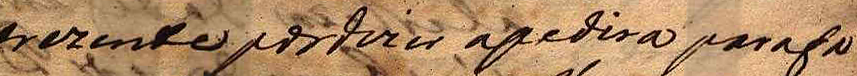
prezente por dizer a pedira para fa
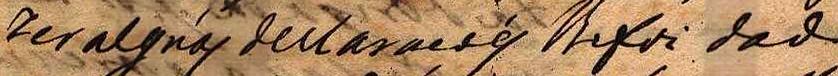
zer alguās declaraçoẽs lhe foi dado
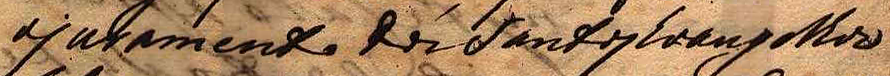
o juramento doz Santos Evangelhoz
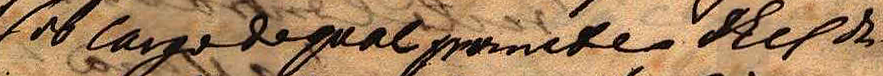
sob cargo do qual prometeo lhes di
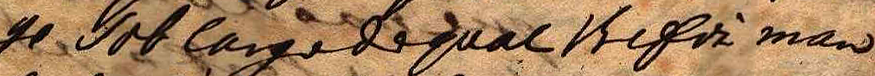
go sob cargo do qual lhe foi man
